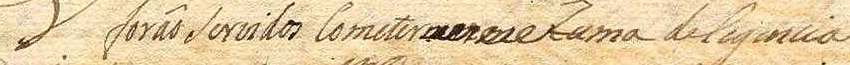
V.os foraõ servidos cometer_ huma deligencia
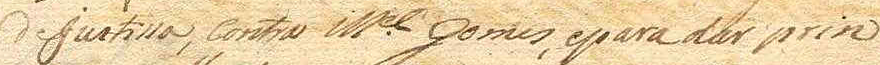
de justissa, contra M.el Gomes, e para dar prin
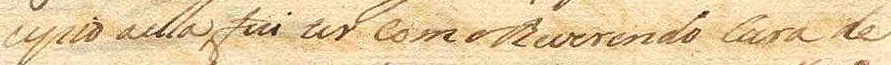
cipio a ella, fui ter com o Reverendo Cura de
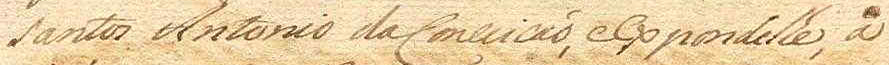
santos Antonio da Conceiaõ, e expondelhe, a
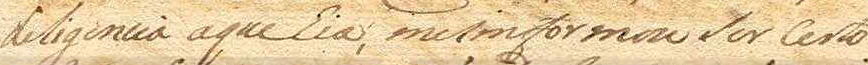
deligencia a que hia; me imformou ser certo
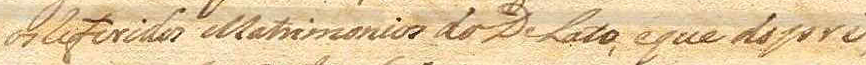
os referidos matrimonios do Delato, e que do pri
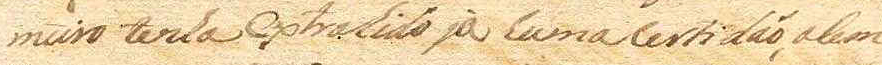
meiro tenha extrahido jà huma certidaõ, alem
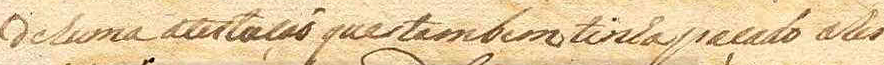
de huma atestaçaõ que tambem tinha paçado a res
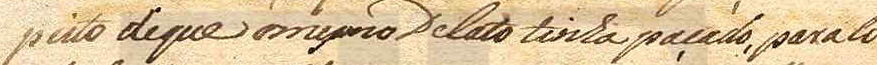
peito de que o mesmo delato tinha paçado, para co
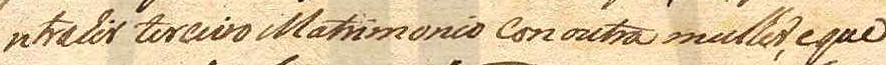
ntrahir terceiro matrimonio con outra mulher, e que
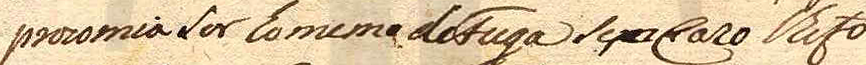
prezomia ser homem de Fuga se por Cazo lhe fo
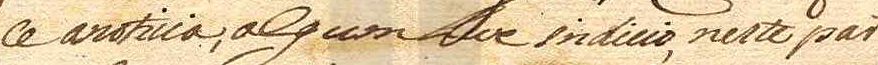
ce a noticia, algum leve indicio, neste par
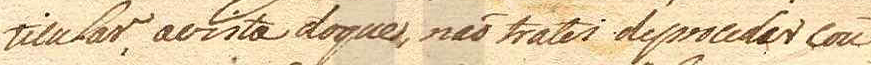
ticular, a vista do que, naõ tratei de proceder cou
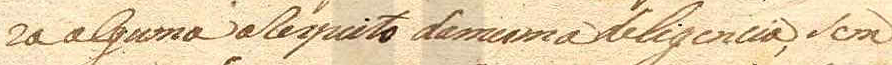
za alguma a respeito da mesma deligencia, sem
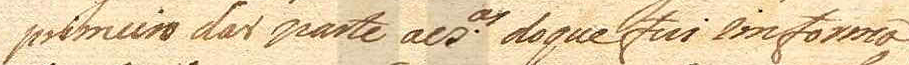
primeiro dar parte a v s.as do que fui imforma
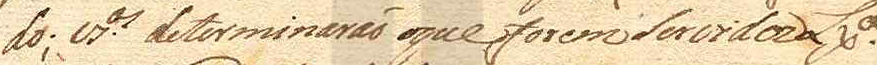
do; v s.as determinaraõ o que forem servidoz Lx.a
